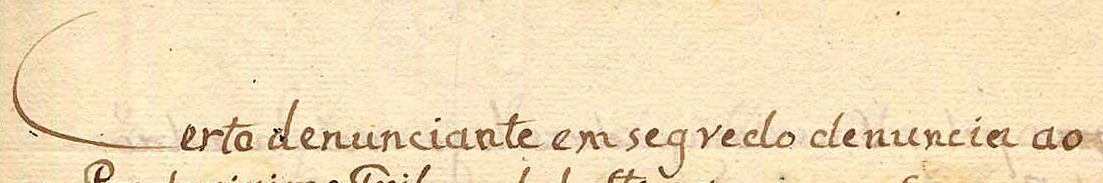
Certo denunciante em segredo denuncia ao
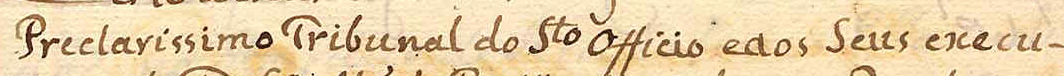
Preclarissimo Tribunal do S.to officio e aos seus execu
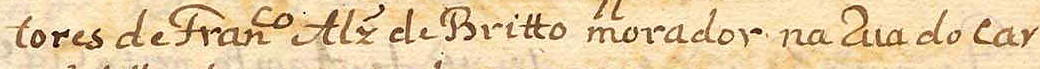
tores de Franco Alz̄ de Britto morador na Rua do car
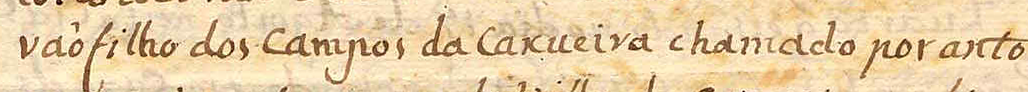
vão filho dos campos da caxueira chamado por anto
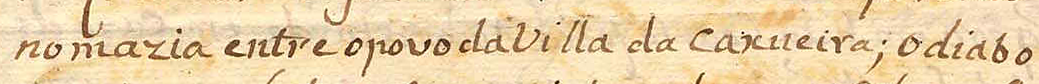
nomazia entre o povo da villa da caxueira; o diabo
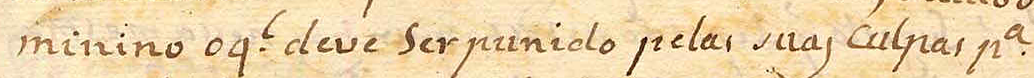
minino o q̄ deve ser punido pelas suas culpas p.a
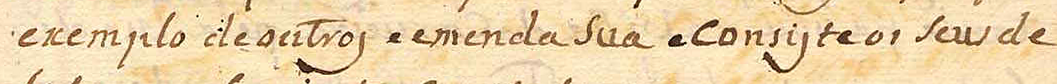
exemplo de outros e emenda sua e consiste os seus de
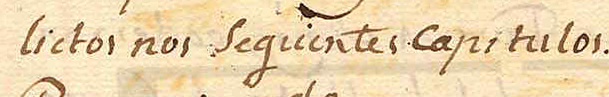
lictos nos seguintes capitulos.
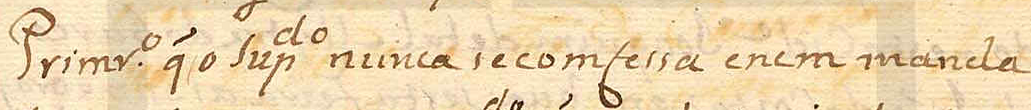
Primr.o q̄ o sup.do nunca se comfessa, e nem manda
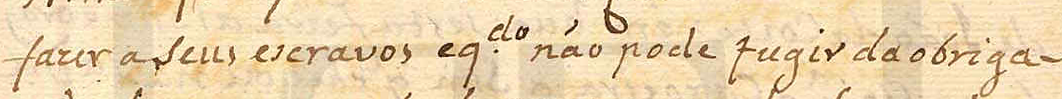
fazer a seus escravos e q.do não pode fugir da obriga
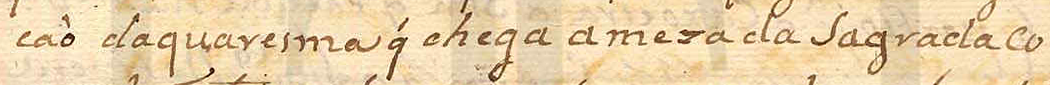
çaõ da quaresma q̄ chega a meza da sagrada co
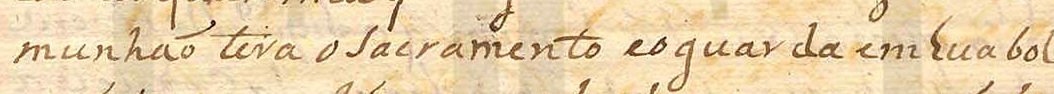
munhaõ tira o sacramento e o guarda em hua bol
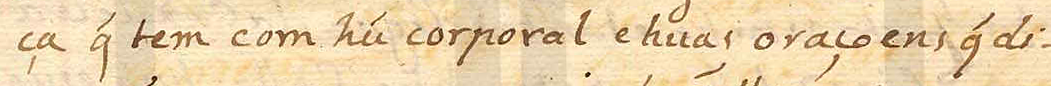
ça q̄ tem com hū corporal e huas oraçoens q̄ di
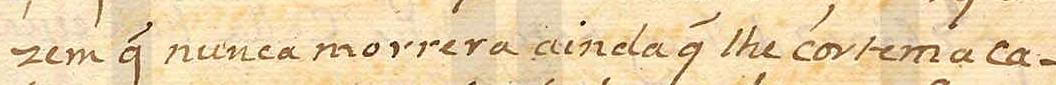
zem q̄ nunca morrera ainda q̄ lhe cortem a ca
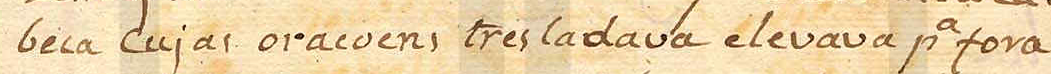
beça Cujas oraçoens tresladava e levava p.a fora
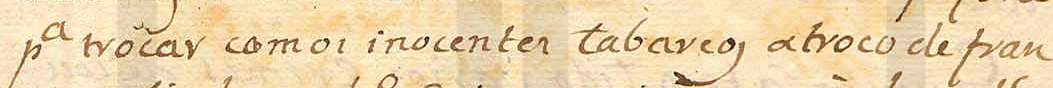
pa trocar com os inocentes tabareos a troco de fran
